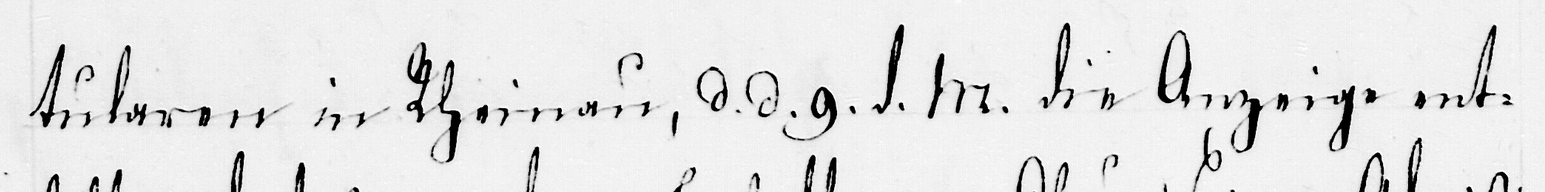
tularen in Rheinau, d. d. 9. d. M. die Anzeige ent¬
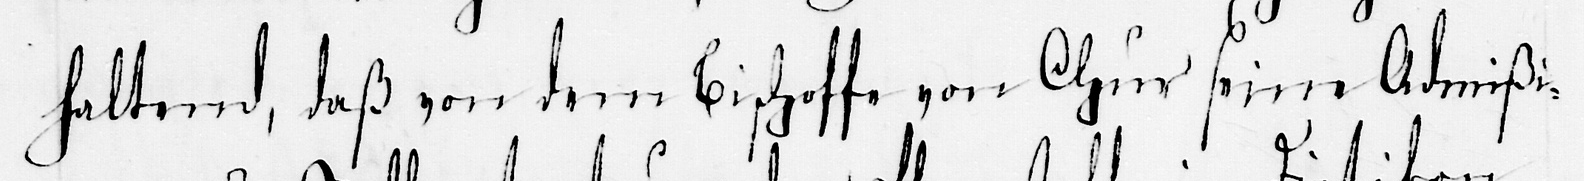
haltend, daß von dem Bischoffe von Chur seine Admißi¬
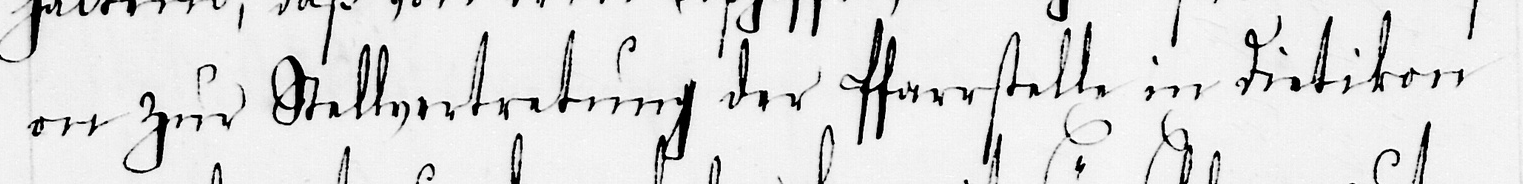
on zur Stellvertretung der Pfarrstelle in Dietikon
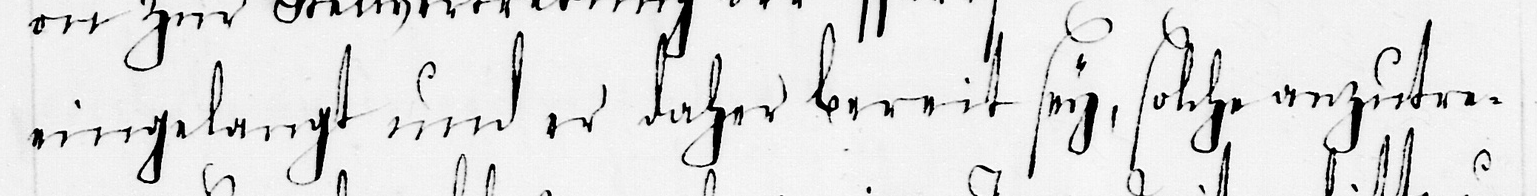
eingelangt und er daher bereit sey, solche anzutre¬
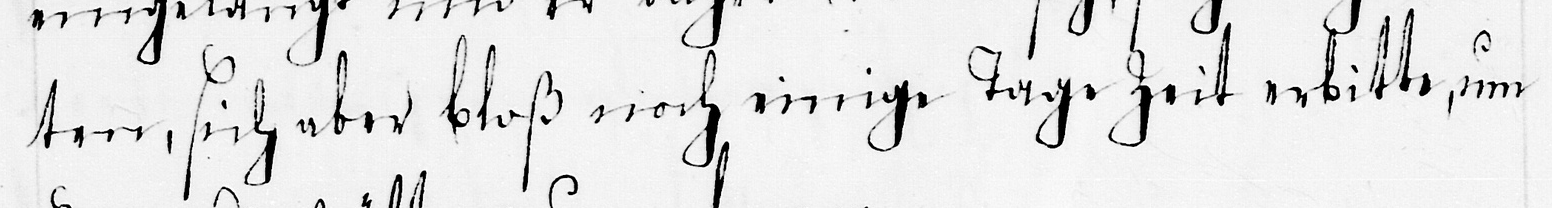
ten, sich aber bloß noch einige Tage Zeit erbitte, um
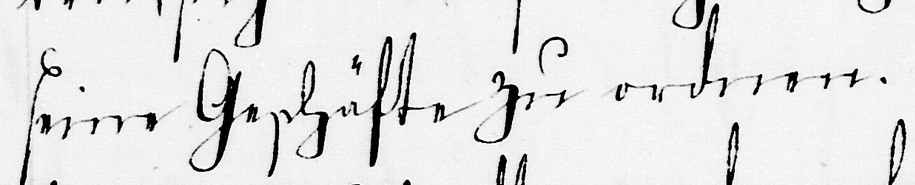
seine Geschäfte zu ordnen.
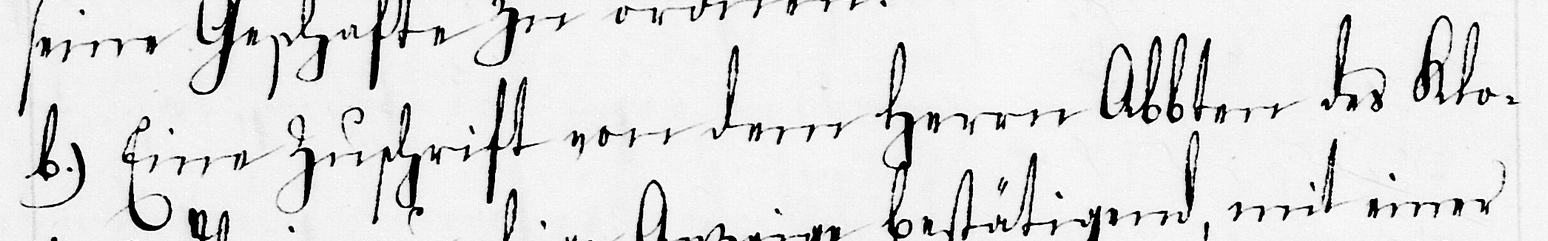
b.) Eine Zuschrift von dem Herrn Abbten des Klo¬
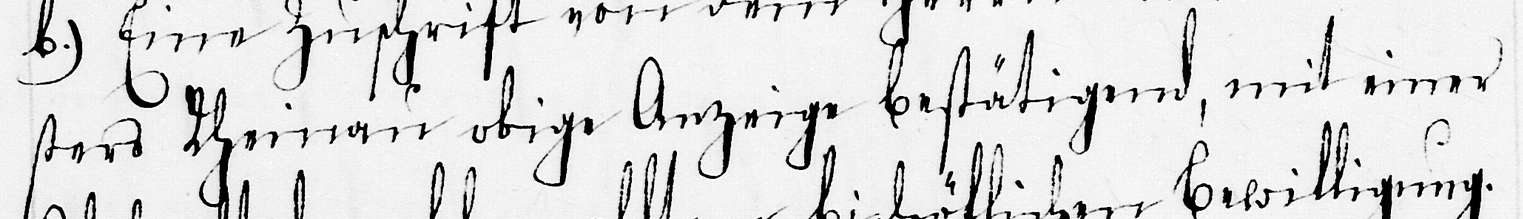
sters Rheinau obige Anzeige bestätigend, mit einer
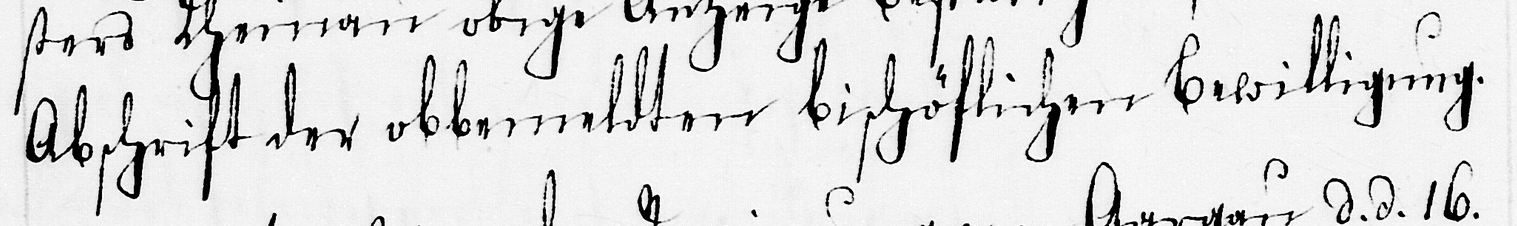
Abschrift der obbemeldten bischöflichen Bewilligung.
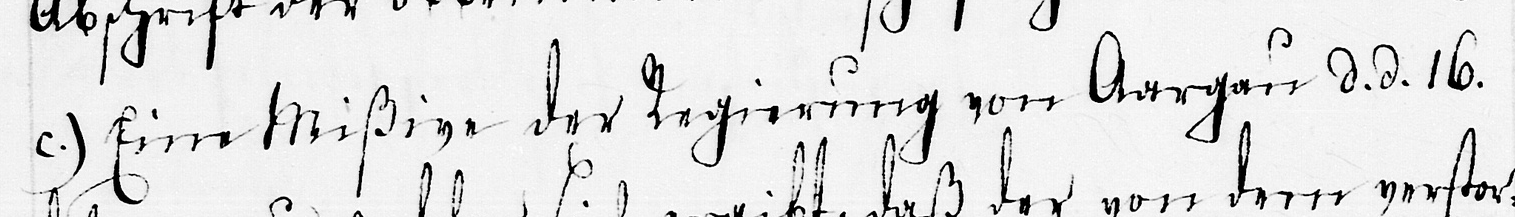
c.) Eine Mißive der Regierung von Aargau d. d. 16.
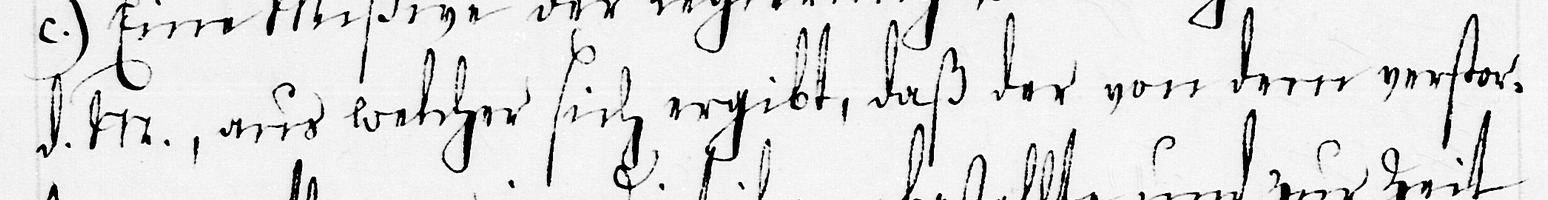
d. M., aus welcher sich ergibt, daß der von dem verstor¬
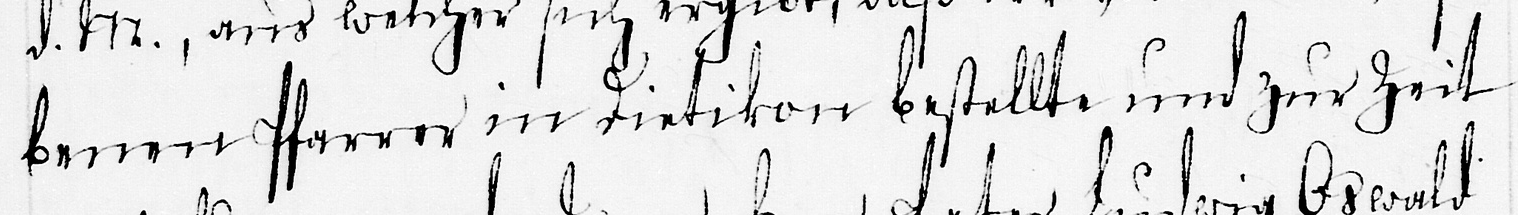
benen Pfarrer in Dietikon bestellte und zur Zeit
